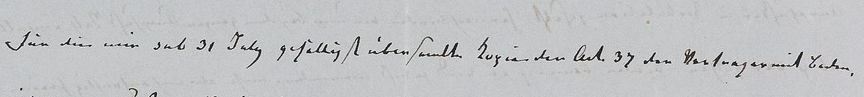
Für die mir sub 31 July gefälligst übersandte Kopie des Art. 37 des Vertrages mit Baden,
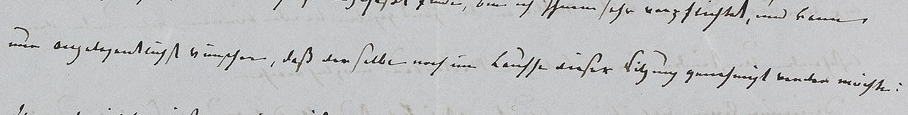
nur angelegentlichst wünschen, daß derselbe noch im Lauffe dieser Sitzung genehmigt werden möchte:
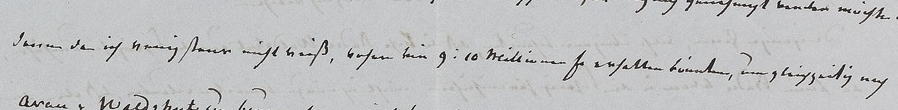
Denn da ich wenigstens nicht weiß, woher wir 9:10 Millionen Fr erhalten könnten, um gleichzeitig nach
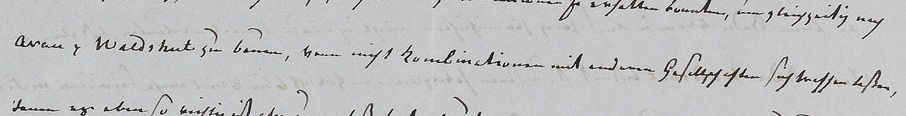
Arau & Waldshut zu bauen, wenn nicht Kombinationen mit anderen Gesellschaften sich treffen laßen,
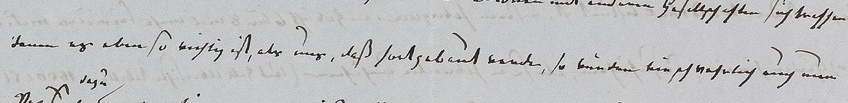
denen es ebenso wichtig ist, als uns, daß fortgebaut werde, so würden wir schwehrlich auch nur
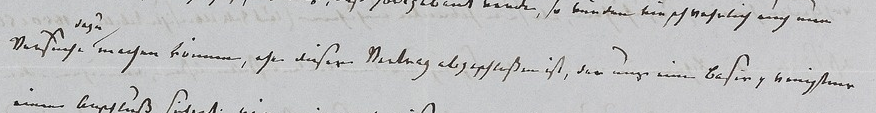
Versuche dazu machen können, ehe dieser Vertrag abgeschloßen ist, der uns eine Basis & wenigstens
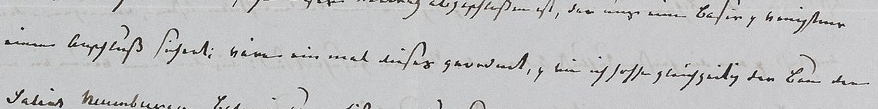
einen Beschluß sichert; wäre ein mal dieses geordnet, & wie ich hoffe gleichzeitig der Bau der
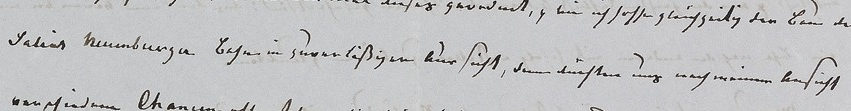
Neuenburger Bahn in zuverläßiger Aussicht, dann dürften uns nach meiner Ansicht
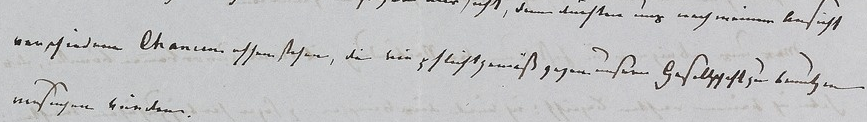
verschiedene Chancen offen stehen, die wir pflichtgemäß gegen unsere Gesellschaft zu benutzen
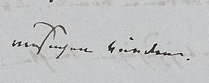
versuchen würden.
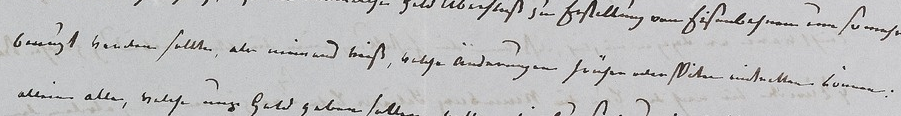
benuzt werden sollte, als niemand weiß, welche Änderungen früher oder später eintretten können:
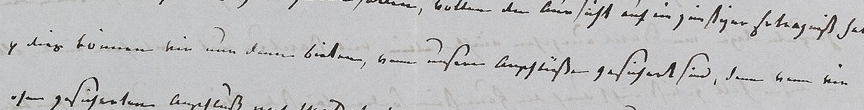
& dies können wir nur dann bieten, wenn unsere Anschlüße gesichert sind, denn wenn wir
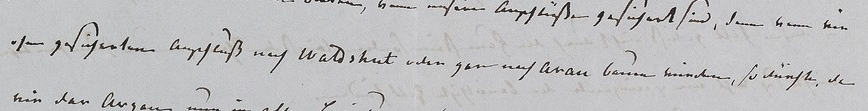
ohne gesicherten Anschluß nach Waldshut oder gar nach Arau bauen würden, so dürfte, da
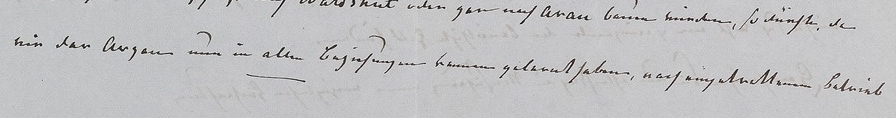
wir den Argau nun in allen Beziehungen kennen gelernt haben, nach eingetrettenem Betrieb
